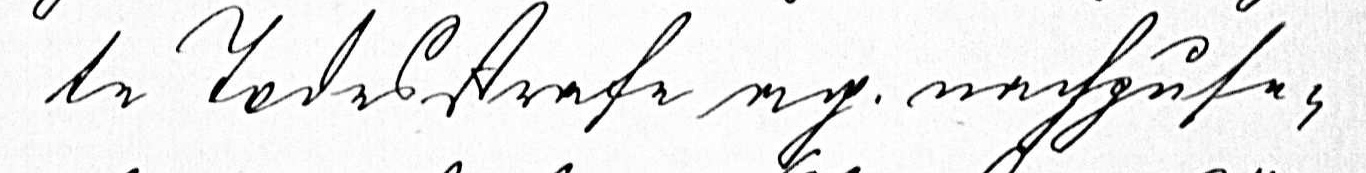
ten Todesstrafe ag. Nachzuse¬
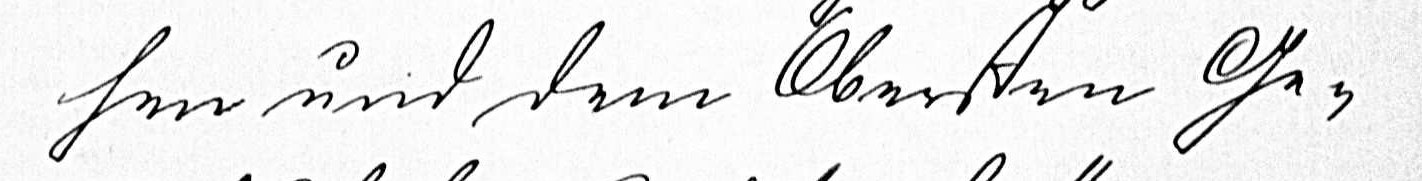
hen und dem Obersten Ge¬
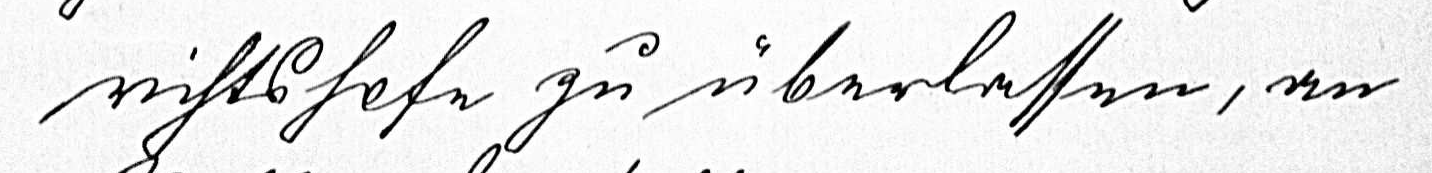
richtshofe zu überlassen, an
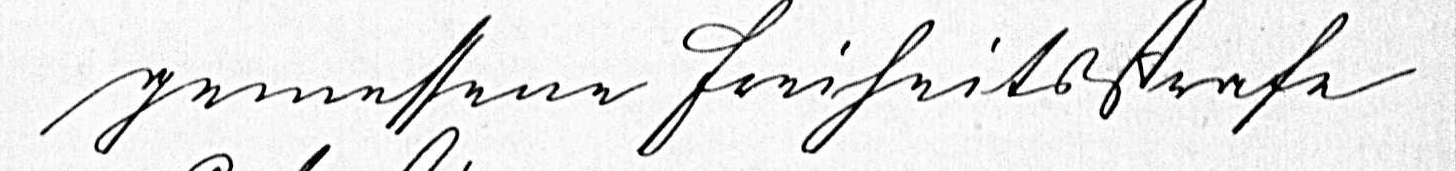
gemessene Freiheitsstrafe
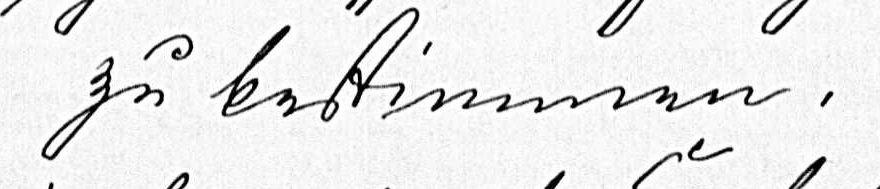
zu bestimmen.
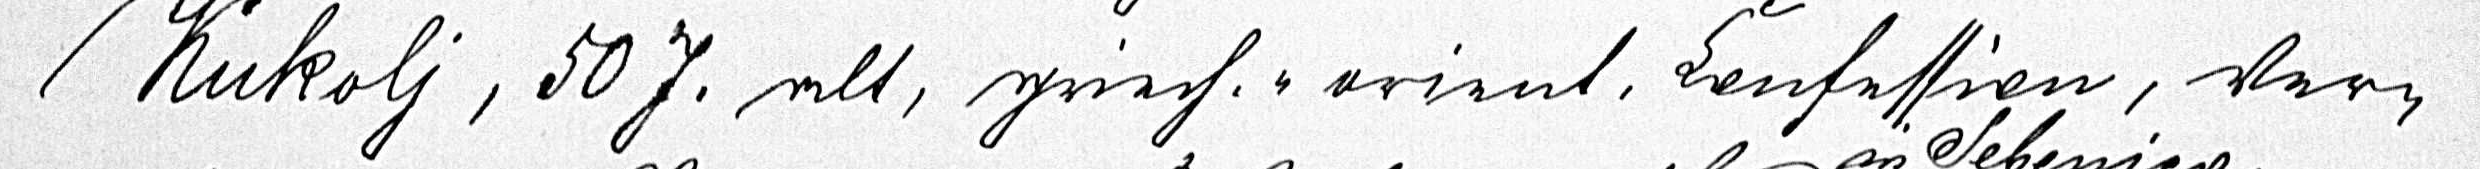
Kukolj, 50 J. alt, griech.-orient. Confession, ver¬
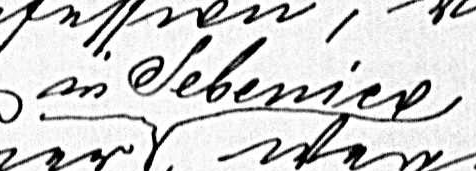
in Sebenice
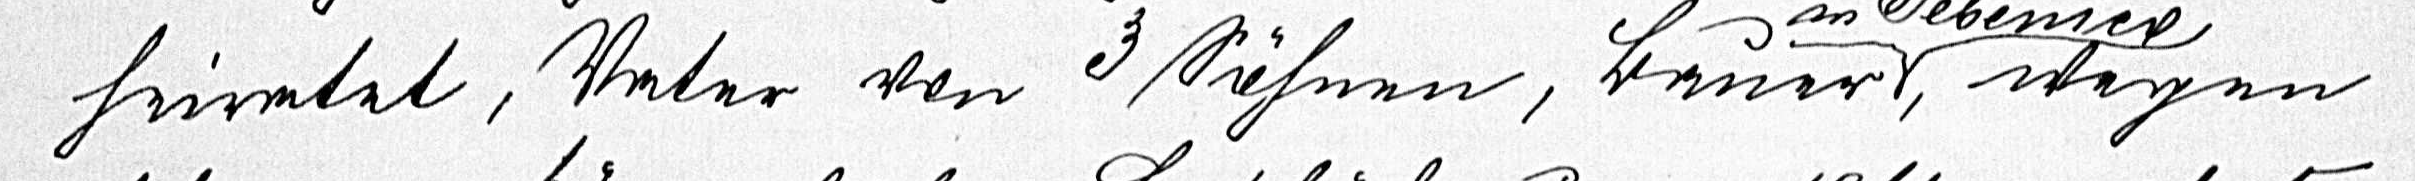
heiratet, Vater von 3 Söhnen, Bauer, wegen
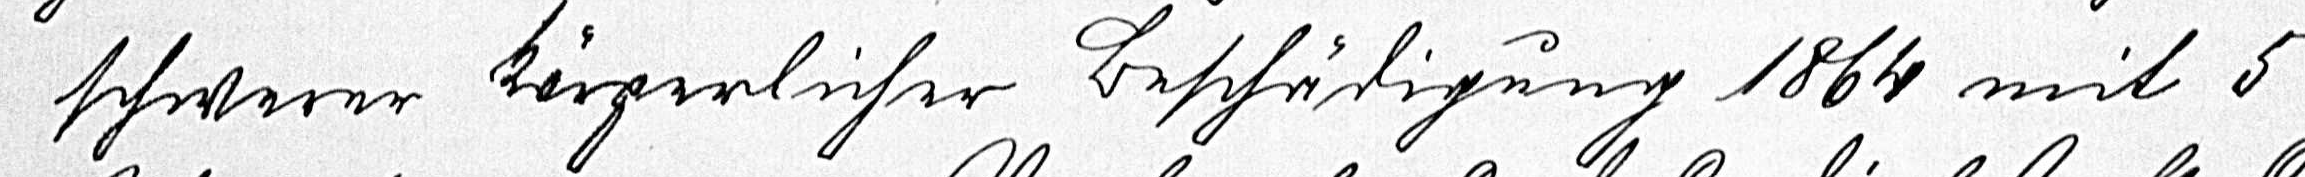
schwerer körperlicher Beschädigung 1864 mit 5
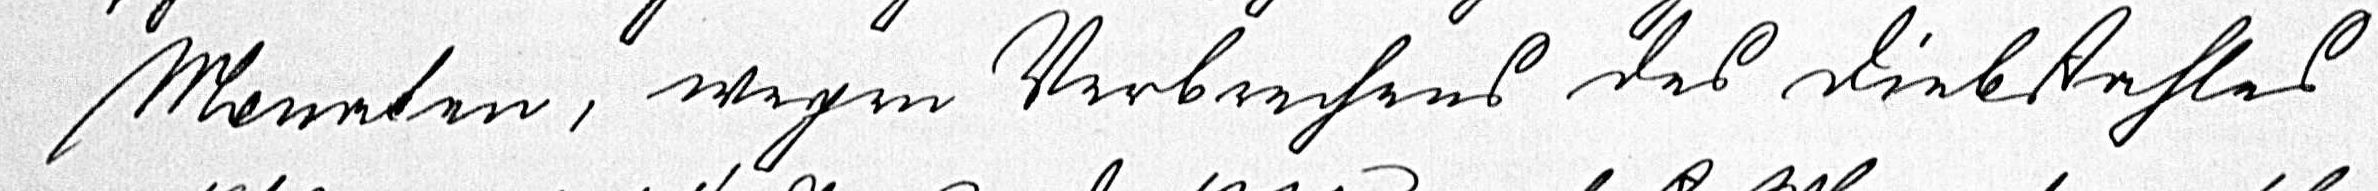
Monaten, wegen Verbrechens des Diebstahles
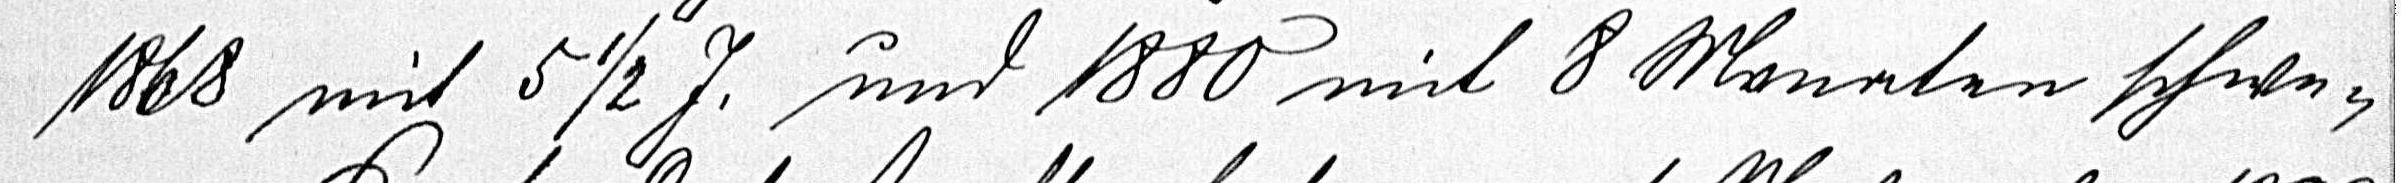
1868 mit 5 ½ J. und 1880 mit 8 Monaten schwa¬
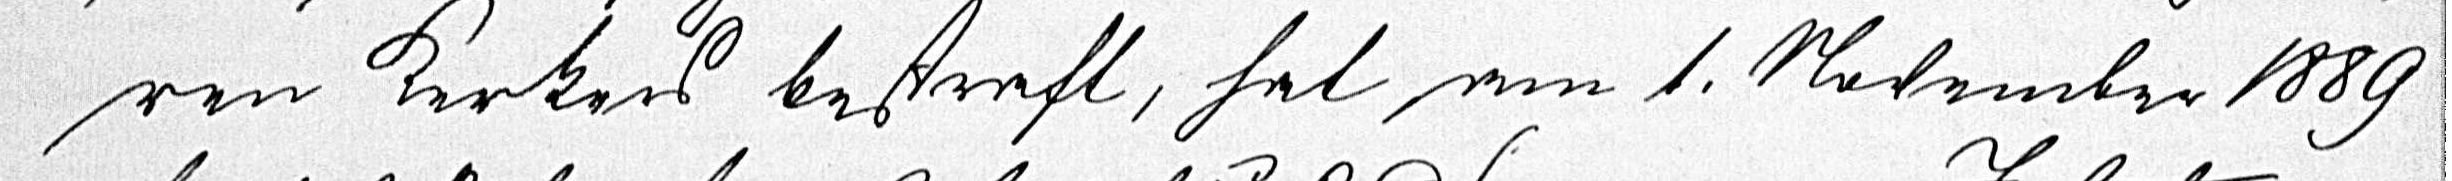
ren Kerkers bestraft, hat am 1. November 1889
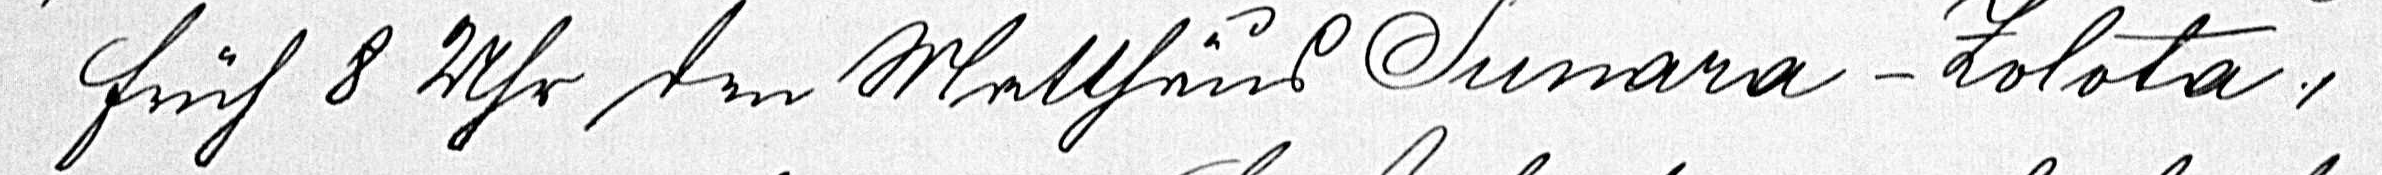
früh 8 Uhr den Matthäus Sumara-Zolota,
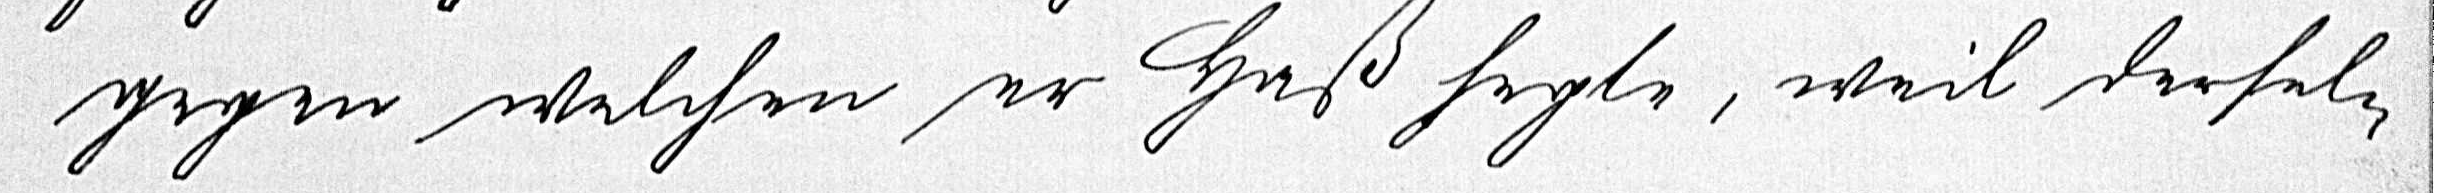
gegen welcher er Haß hegte, weil dersel¬
